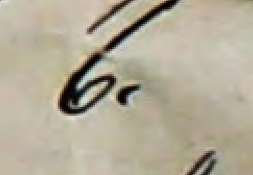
6.
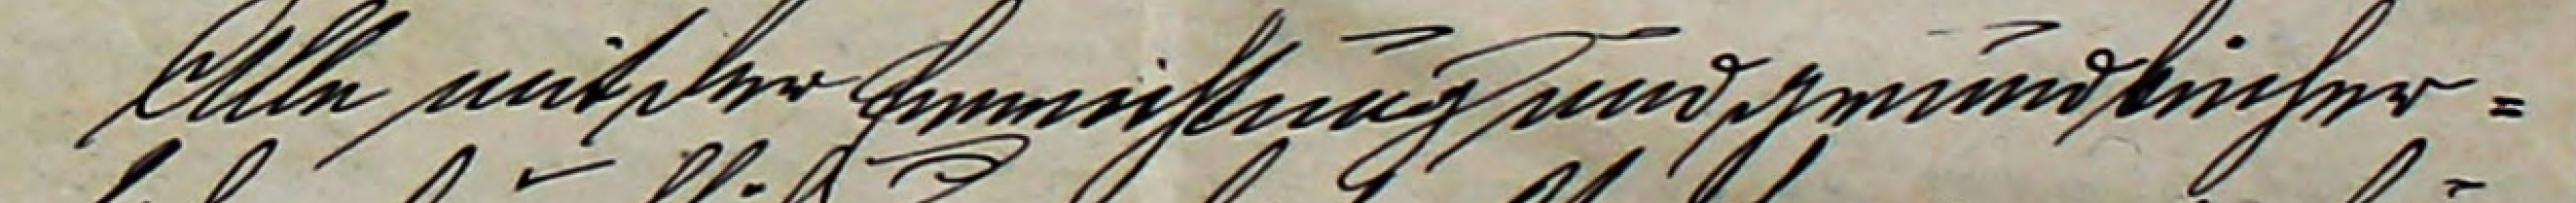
Alle mit der Errichtung und grundkicher=
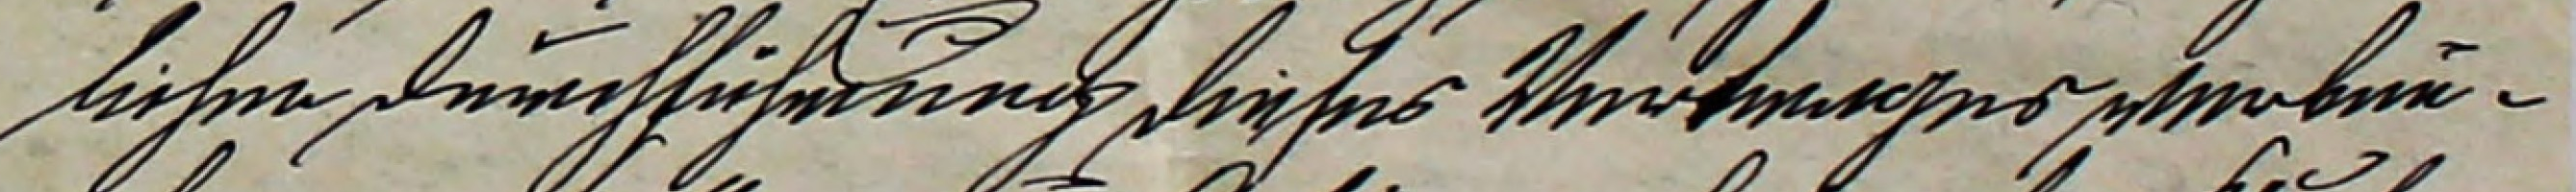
lichen Durchführung dieses Vertrages verkau-
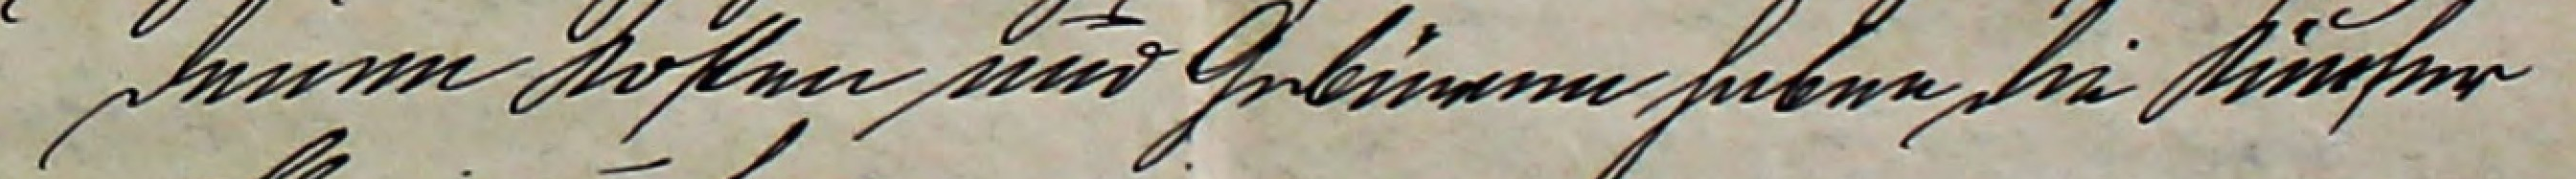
denen kosten und Gebüren Haben die Käufer
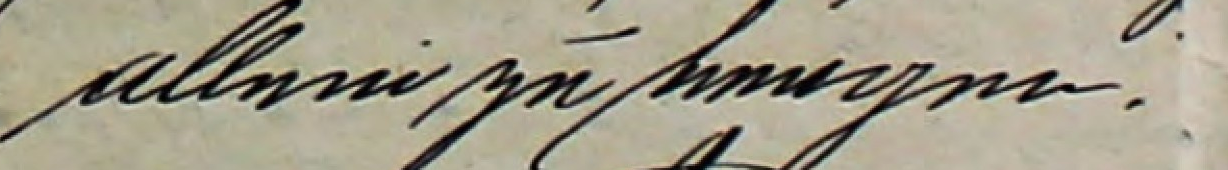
allein zu tragen.
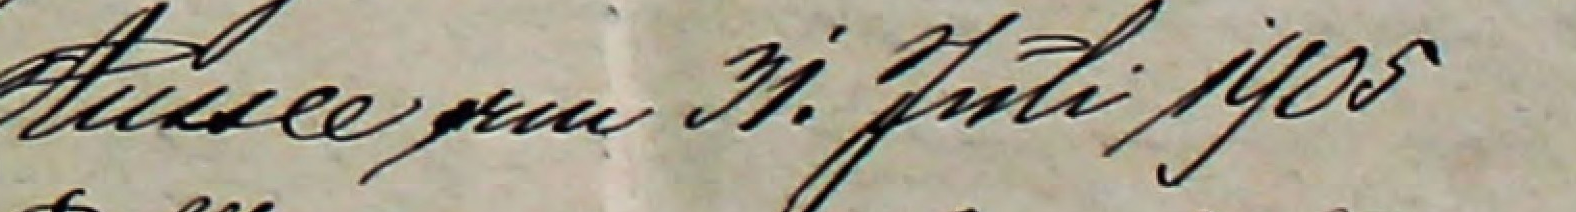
Aussee am 31. Juli 1905
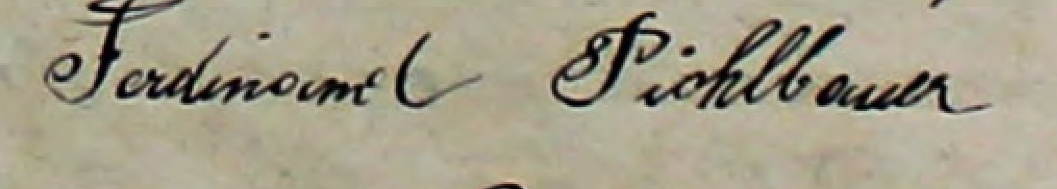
Ferdinand Pichlbauer
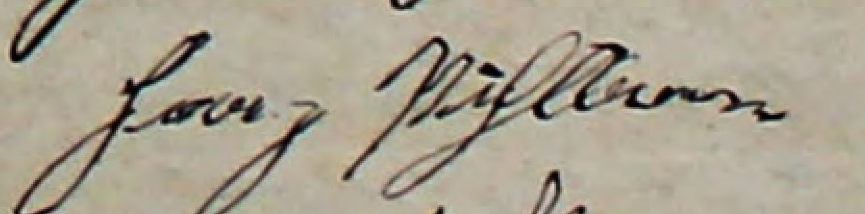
Anna Pichlbauer
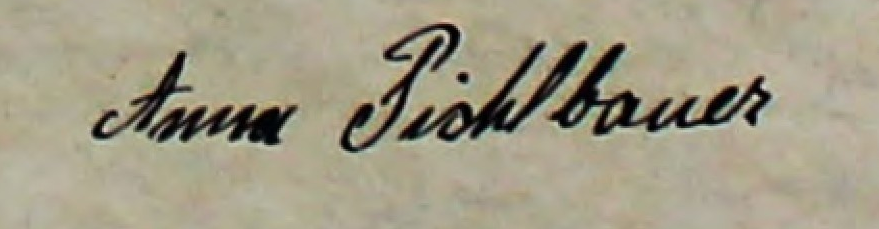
Franz Pichlbauer
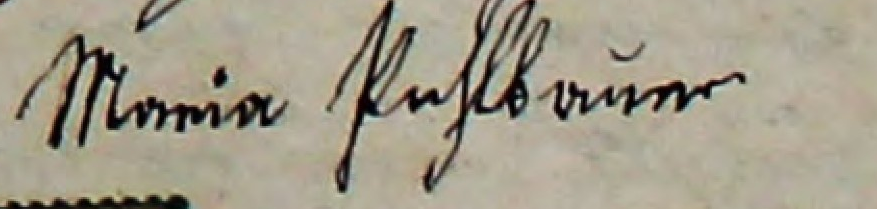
Maria Pichlbauer
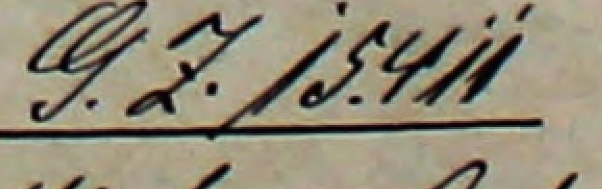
G.Z. 15.411
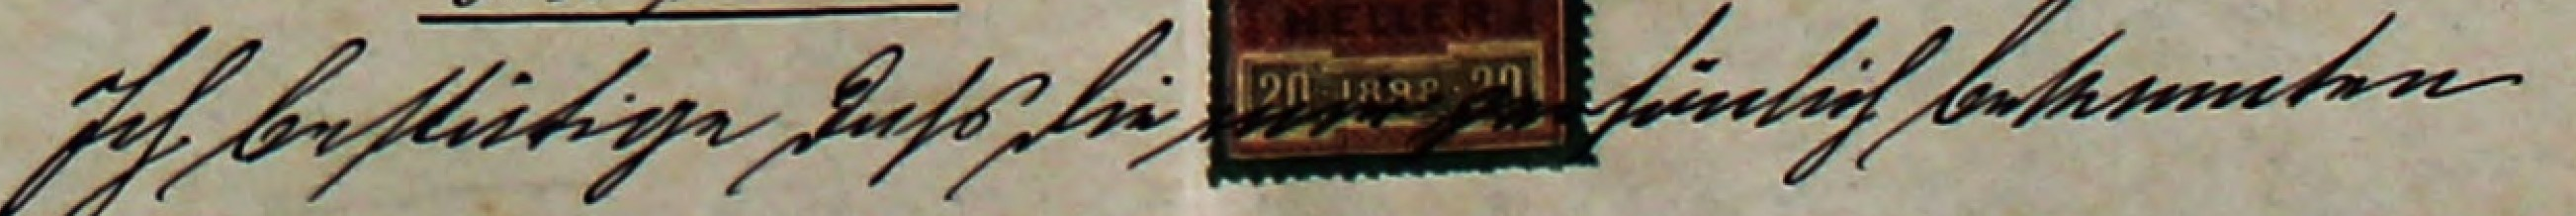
Jch bestätige dass die ???fünlich bekannten
